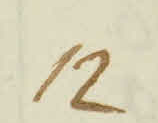12
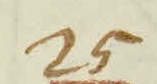25
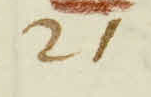21
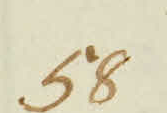58
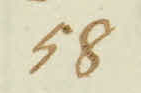58
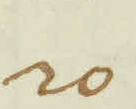20
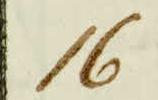16
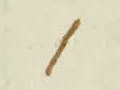1
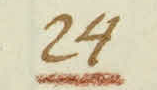24
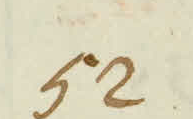52
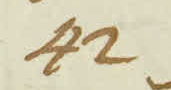42
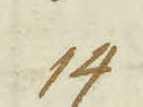14
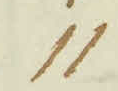11
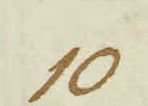10
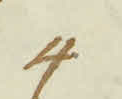4
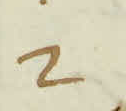2
